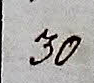30
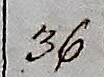36
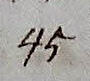45
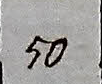50
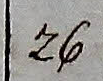26
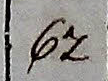62
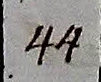44
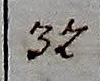32
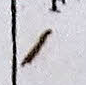1
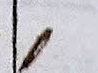1
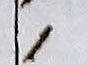1
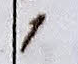1
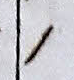1
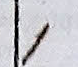1
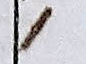1
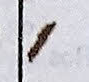1
